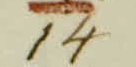14
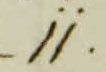11
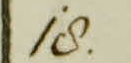18
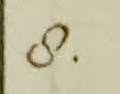8.
